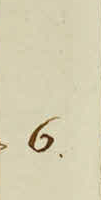6.
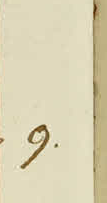9.
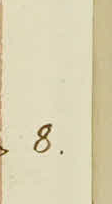8.
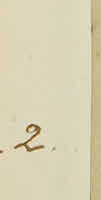2.
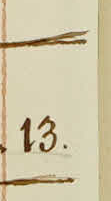13.
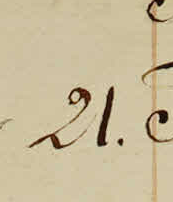21.
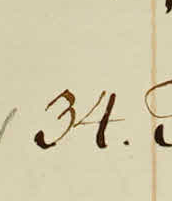34.
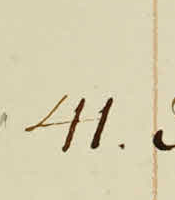41.
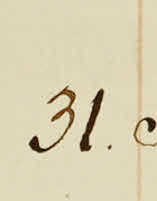31.
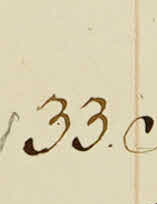33.
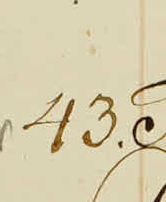43.
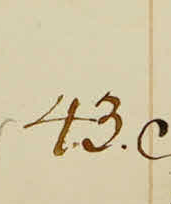43.
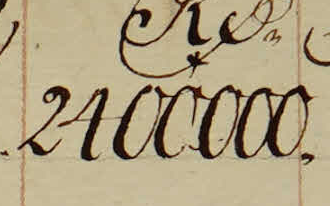240000
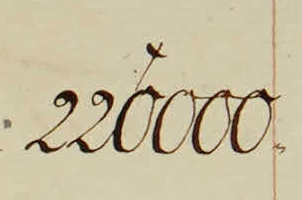220000
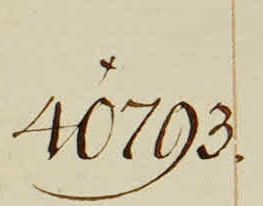40793
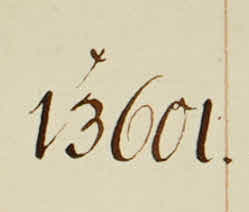13601
